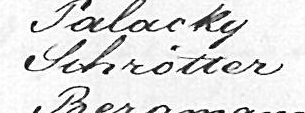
Schrötter
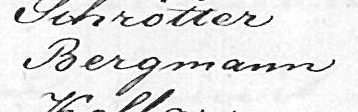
Bergmann
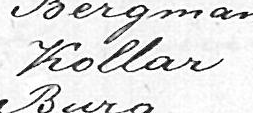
Kollar
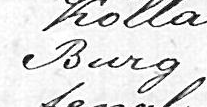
Burg
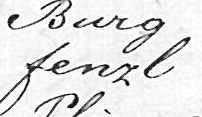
Fenzl
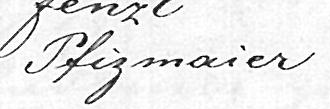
Pfizmaier
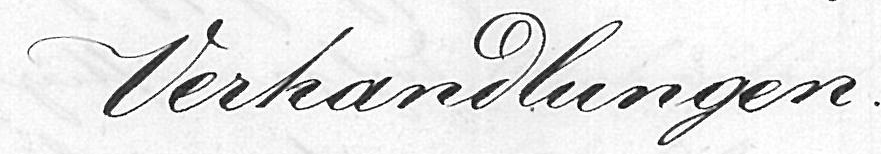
Verhandlungen.
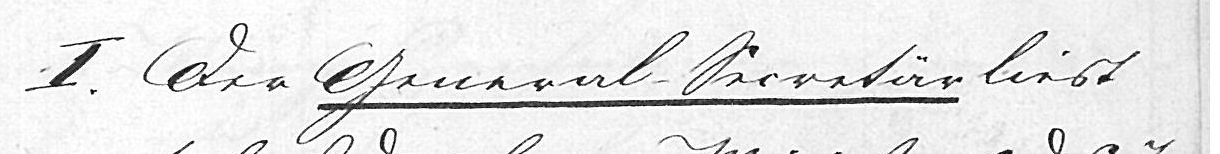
I. Der General-Secretär liest
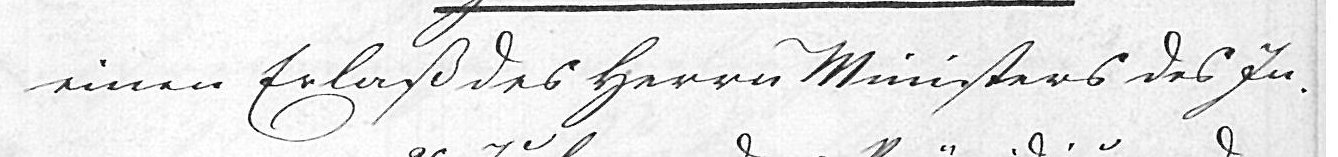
einen Erlaß des Herrn Minister des In-
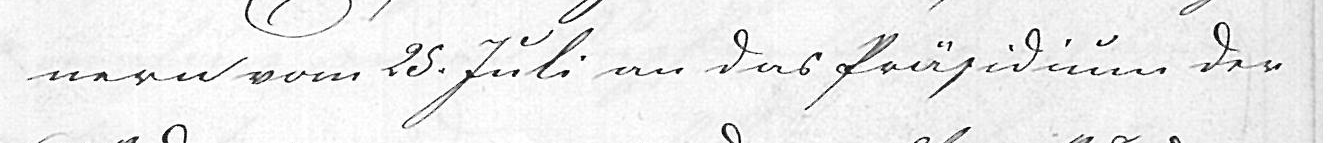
nern vom 25. Juli an das Präsidium der
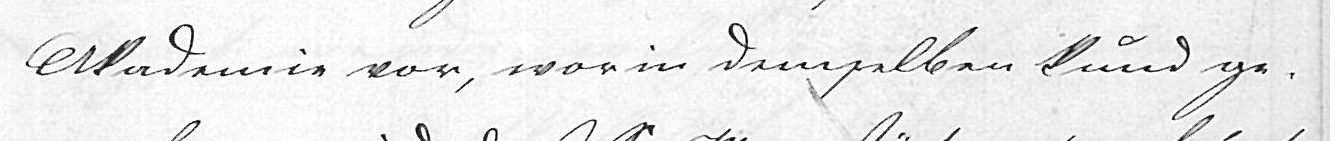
Akademie vor, worin demselben kund ge-
